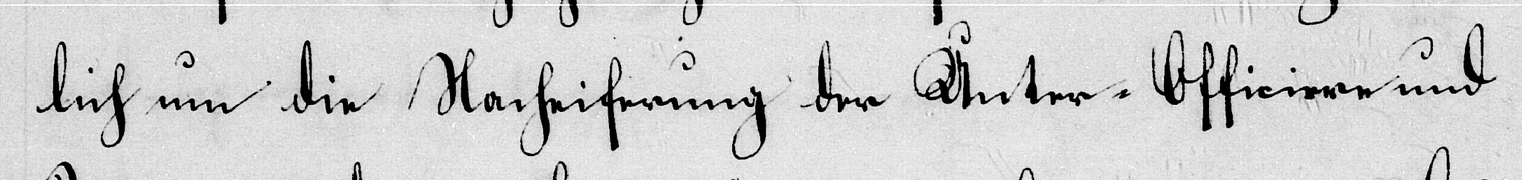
lich um die Nacheiferung der Unter-Officiere und
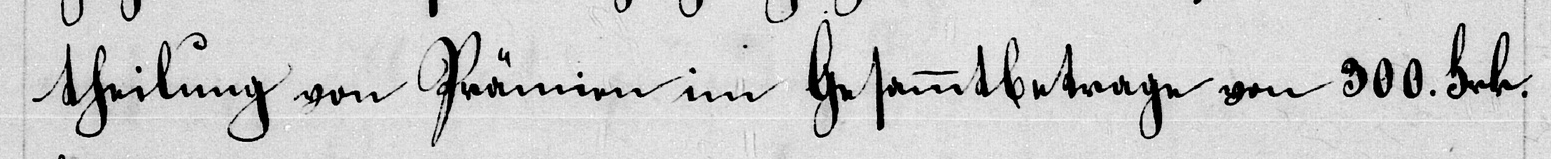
theilung von Prämien im Gesammtbetrage von 300. Frk.
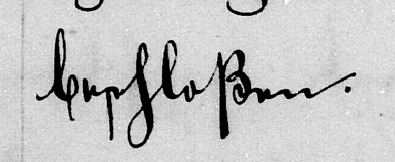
beschloßen.
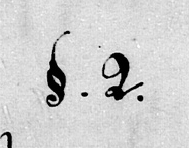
§. 2.
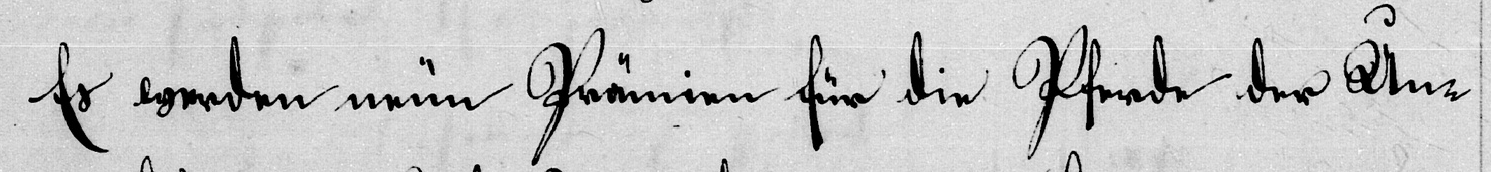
Es werden neun Prämien für die Pferde der Un¬
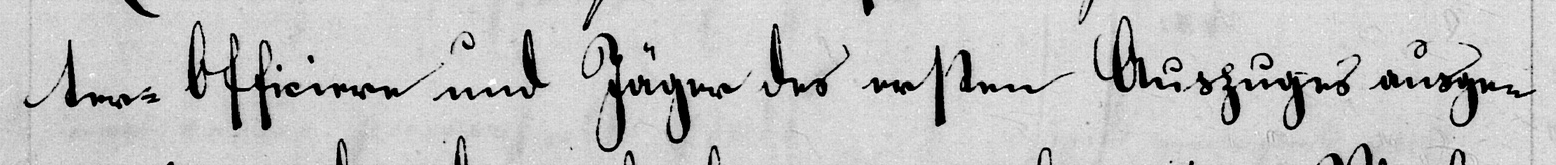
ter-Officiere und Jäger des ersten Auszuges ausge¬
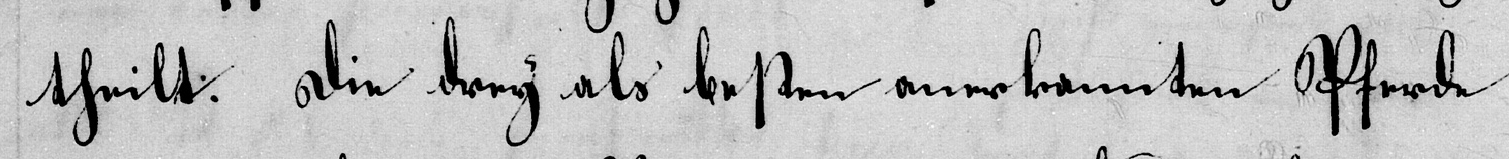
theilt. Die drey als besten anerkannten Pferde
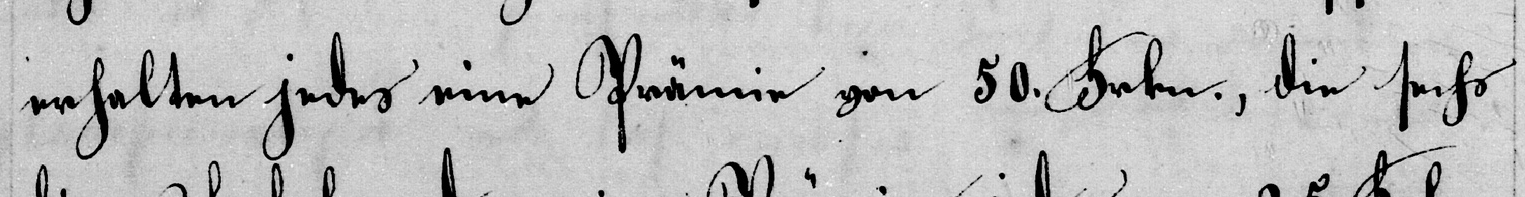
erhalten jedes eine Prämie von 50. Frkn., die sechs
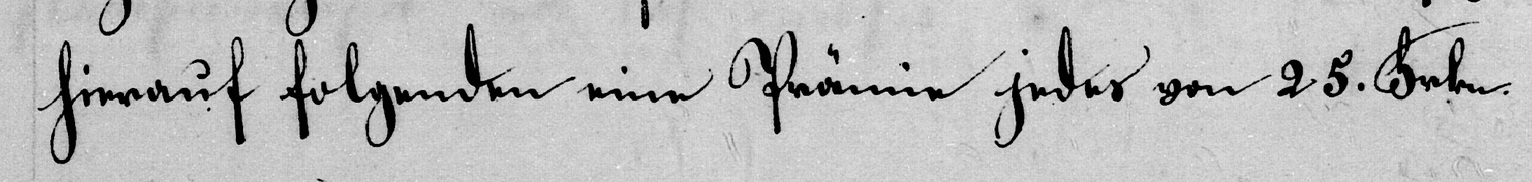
hierauf folgenden eine Prämie jedes von 25. Frkn.
